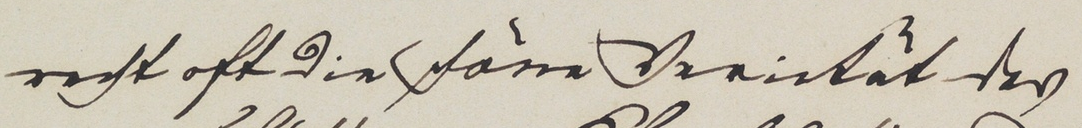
recht oft die schöne Varietät des
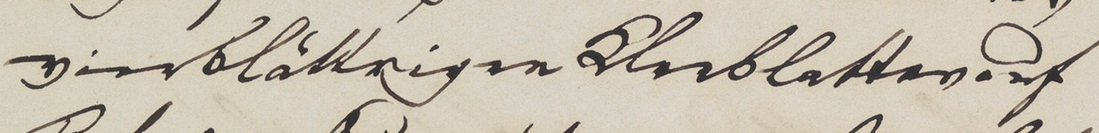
vierblättrigen Kleeblattes auf
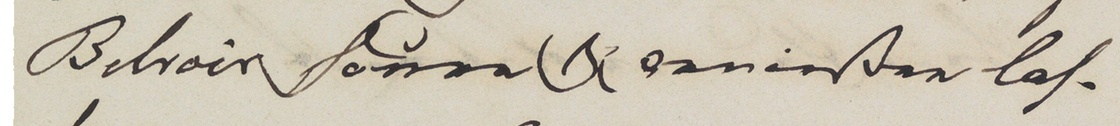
Belvoir schauen & genießen las-
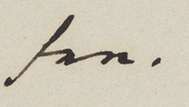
sen.
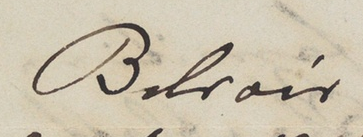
Belvoir
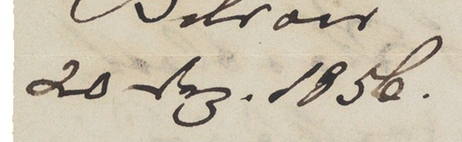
20 Dez. 1856.
